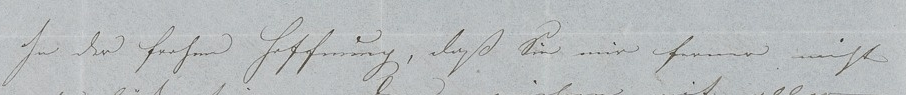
In der frohen Hoffnung, daß Sie mir ferner nicht
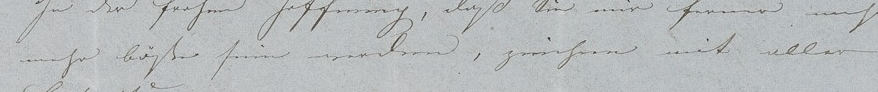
mehr böße sein werden, zeichne mit aller
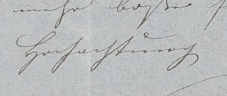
Hochachtung
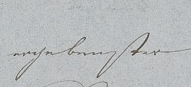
ergebenster
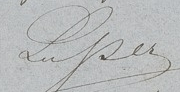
Lusser
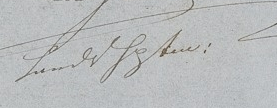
Landshptm:
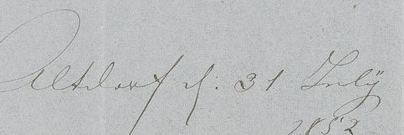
Altdorf d. 31 July
